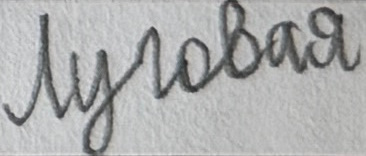луговая
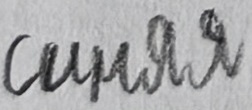синяя
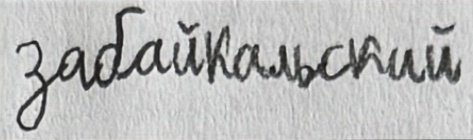забайкальский
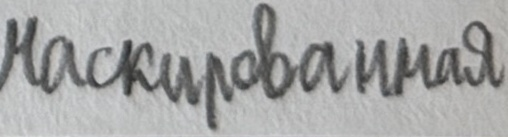маскированная
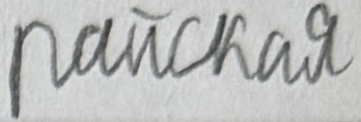райская
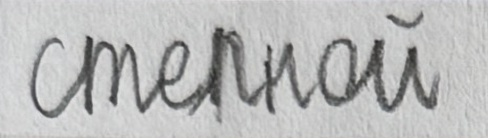степной
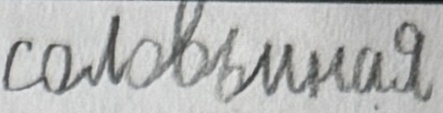соловьиная
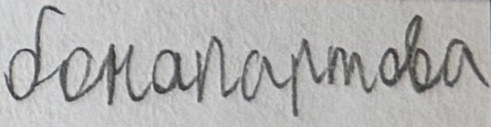банаопартова
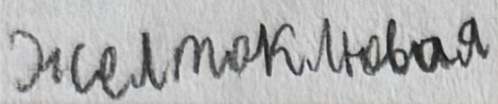желтоклювая
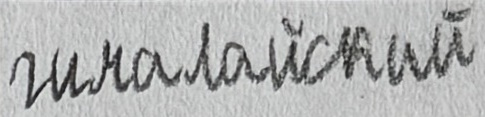гималайский
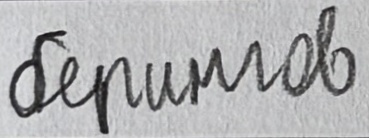берингов
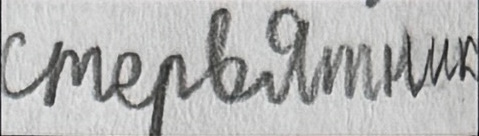стервятник
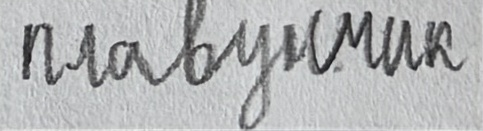плавунчик
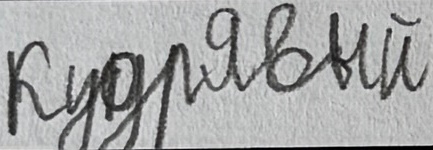кудрявый
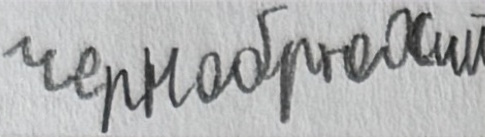чернобрюхий
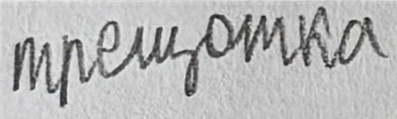трещотка
